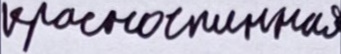красноспинная
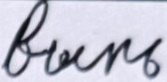выпь
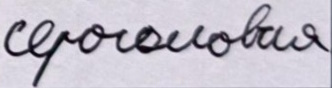сероголовая
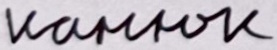канюк
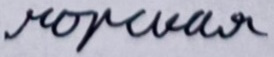морская
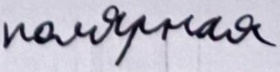полярная
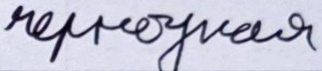черноухая
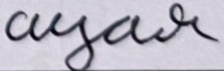сизая
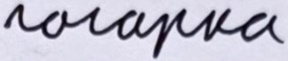гогарка
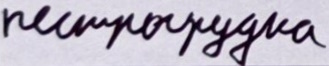пестрогрудка
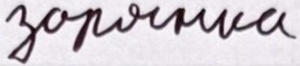зарянка
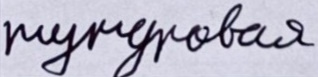тундровая
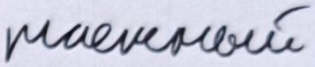таежный
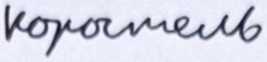коростель
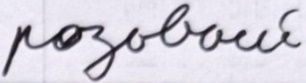розовый
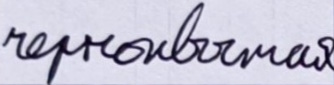чернохвостая
